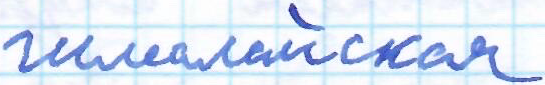гималайская
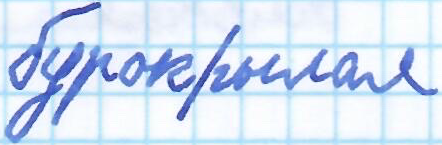бурокрылая
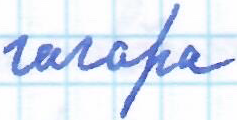гагара
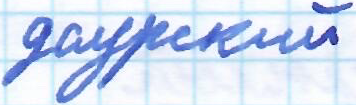даурский
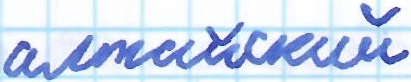алтайский
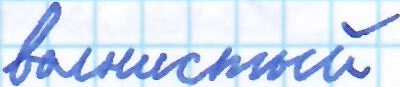волнистый
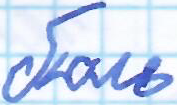бюль
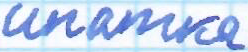ипатка
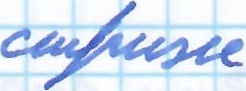стриж
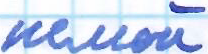немой
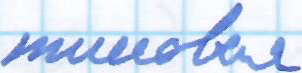тиссовая
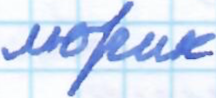люрик
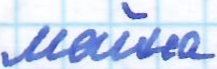майна
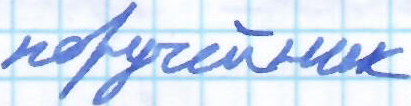поручейник
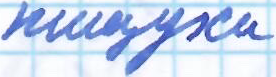пищуха
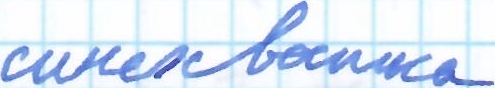синехвостка
